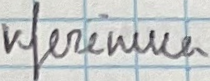кречётка
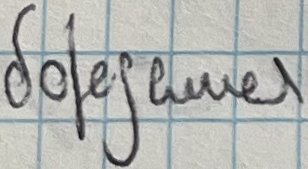бородатая
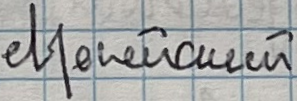европейский
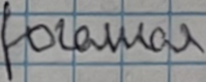рогатая
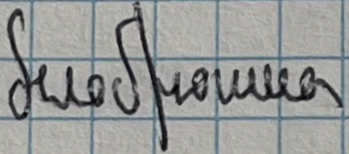белобрюшка
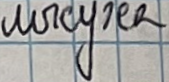лысуха
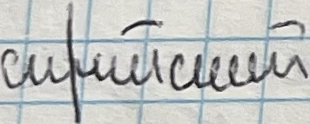сирийский
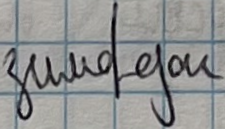зимородок
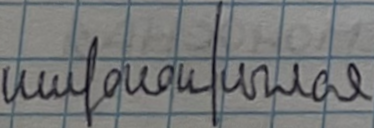ширококрылая
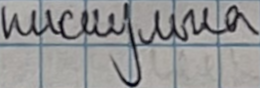пискулька
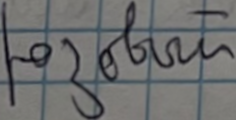розовый
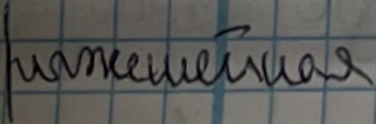рыжешейная
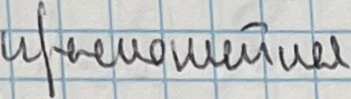красношейная
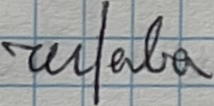чеграва
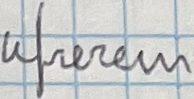кречет
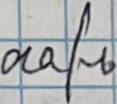огарь
